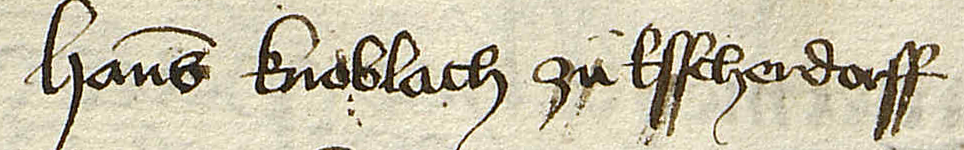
Hans* knoblach cʒü Eſſcherdorff
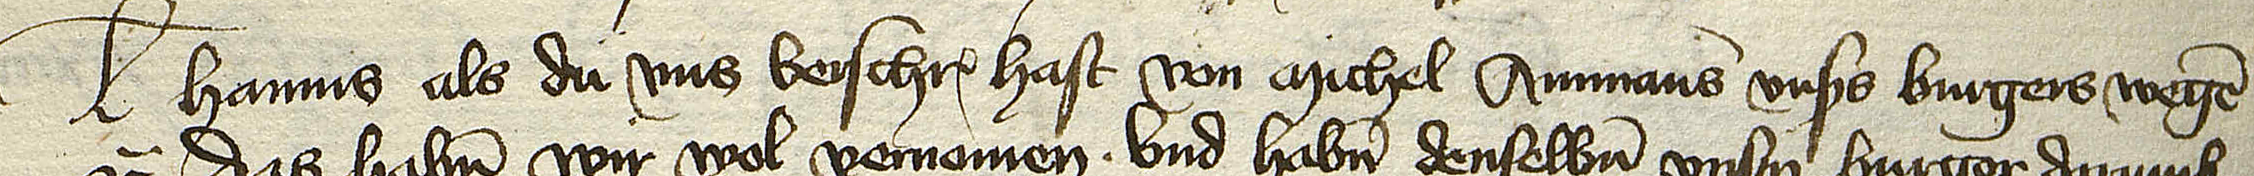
L* hanns als dü vns verſchr* haſt von Michel Ammans* vnſ*s burgers wege*
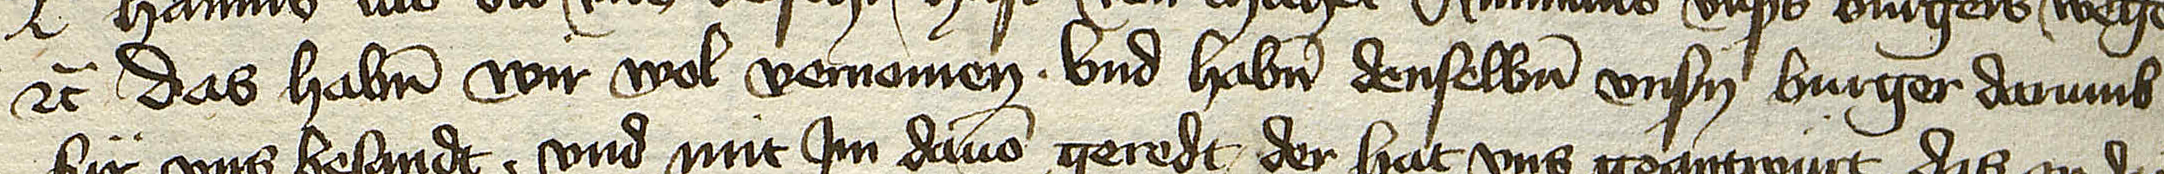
ec* Das hab*n wir wol vernomen . Vnd habn* denſelb*n vnſ*n burger darumb
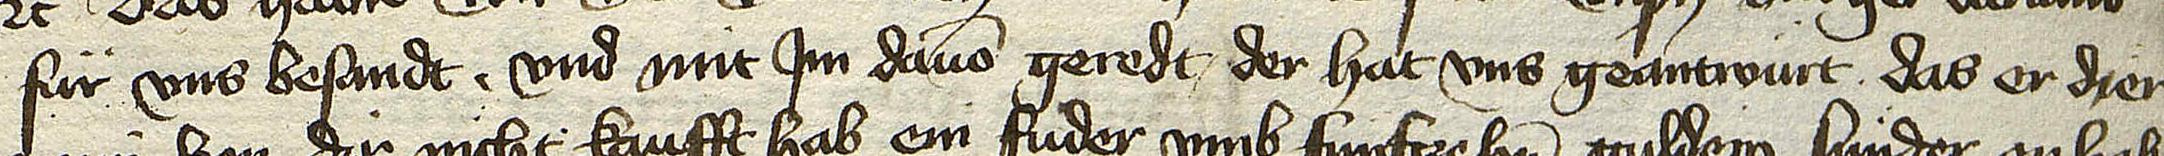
für vns beſandt . vnd mit Im dauo* geredt der hat vns geantwürt . das er der
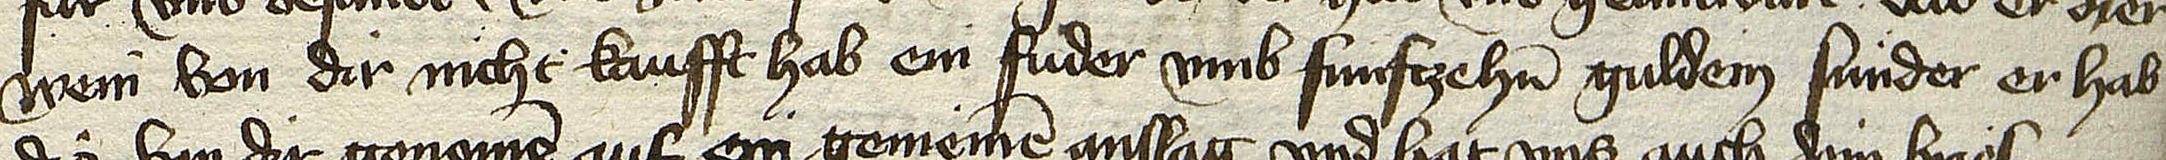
wein von dir nicht kaufft hab ein fuder vmb funfcʒehn* gulden ſünder er hab
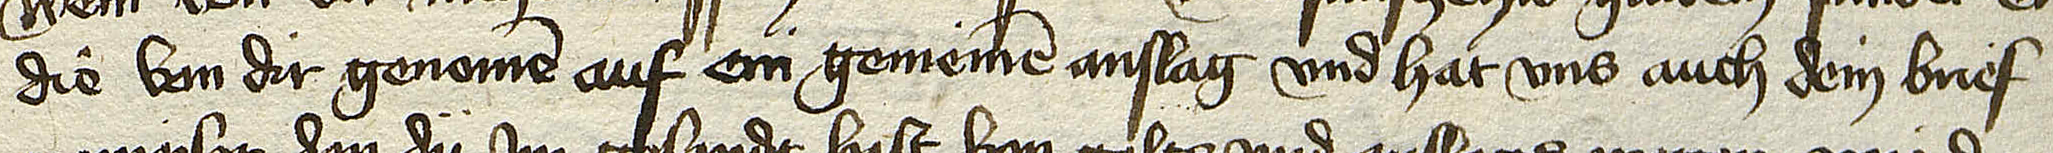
die von dir genome* auf ein gemeine* anſlag vnd hat vns auch dein brief
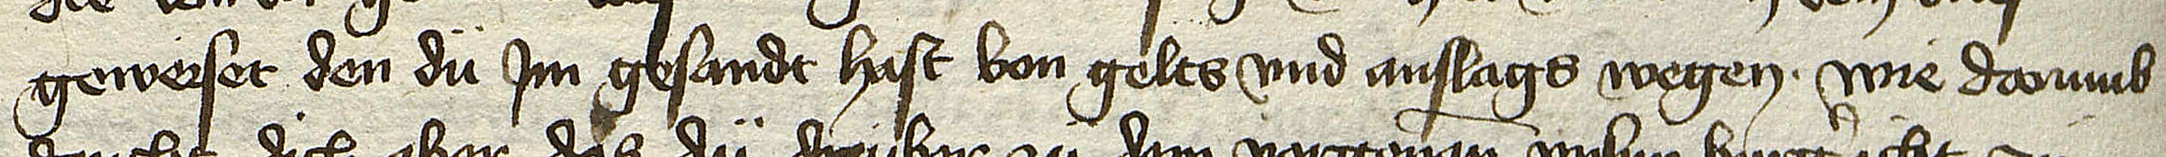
geweiſet den dü Im geſandt haſt von gelts vnd anſlags wegen . wie darumb
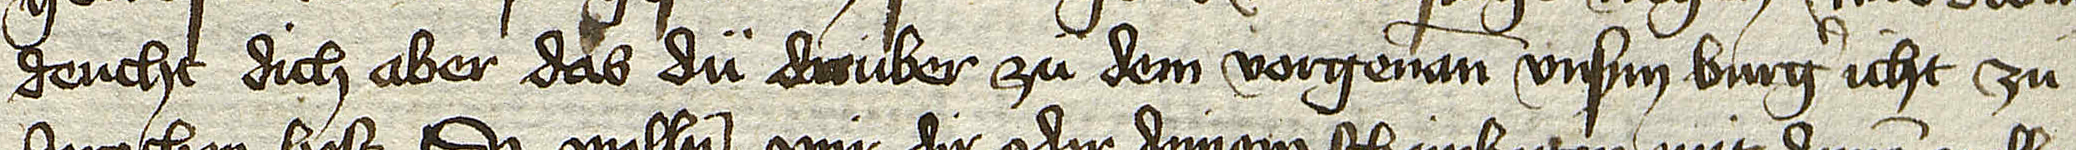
deucht dich aber das dü darüber cʒü dem vorgenan* vnſ*m burg* icht cʒü
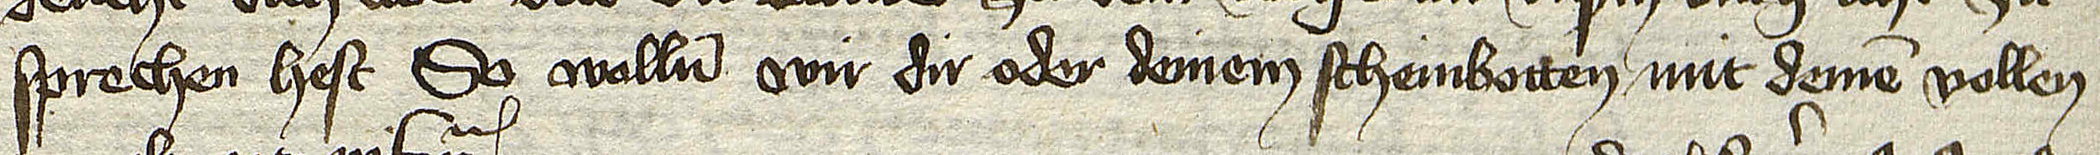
ſprechen heſt So woll*n wir dir oder deinem ſcheinbotten mit deine* vollen
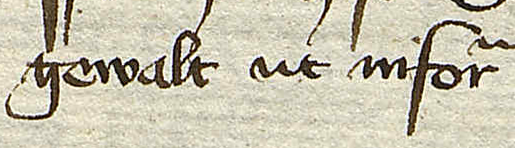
gewalt ut infor*
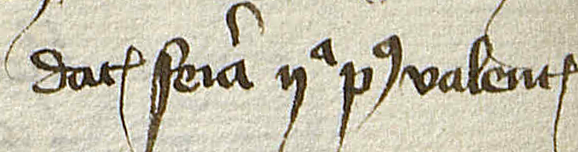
Dat* fe*ia ii* p* valent*
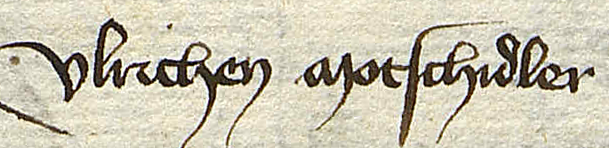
Vlrichen Motſchidler
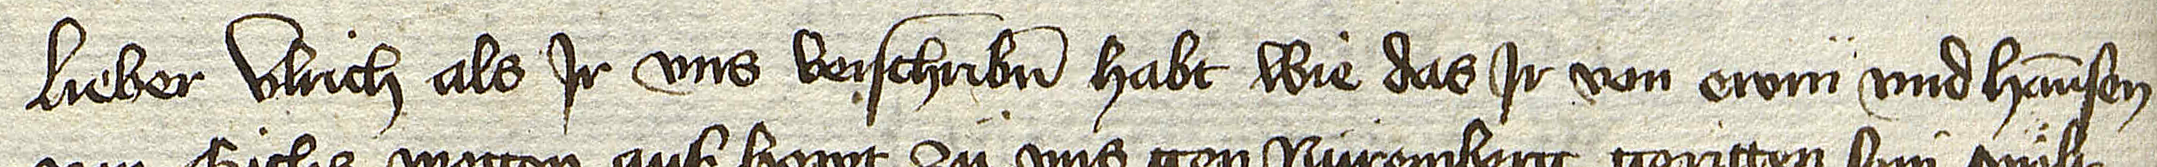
Lieber Vlrich als Ir vns verſchrib*n habt wie das Ir von ewm* vnd hanſen*
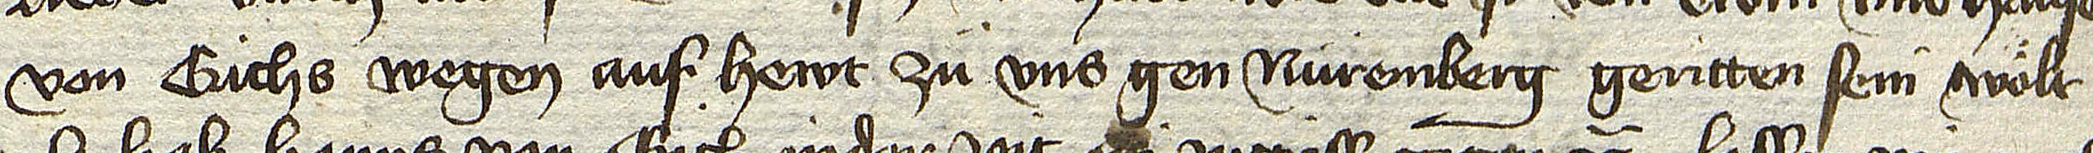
von Gichs wegen auf hewt cʒü vns gen Nüremberg geritten ſein wölt
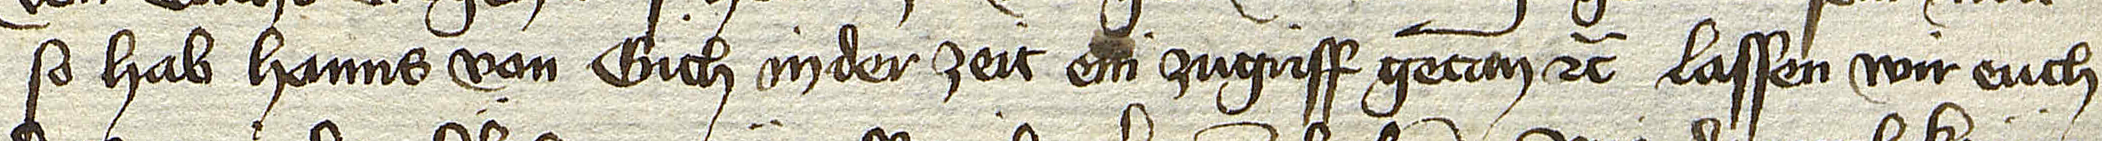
ſo hab hanns von Gich in der ʒeit ein ʒugriff getan* ec* laſſen wir euch
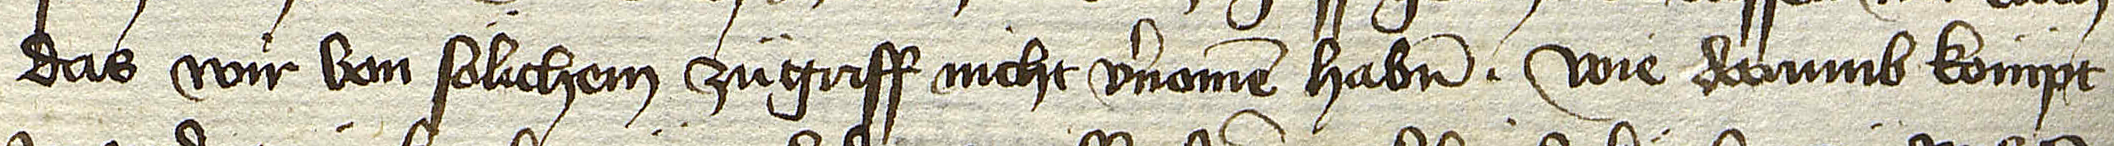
das wir von ſölichem ʒügriff nicht v*nome* hab*n . Wie darum kömpt
